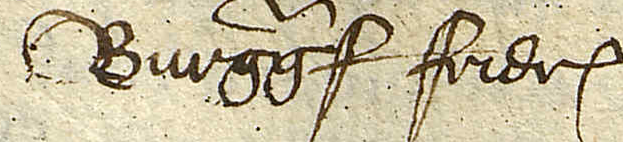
Burgg*f fridr*
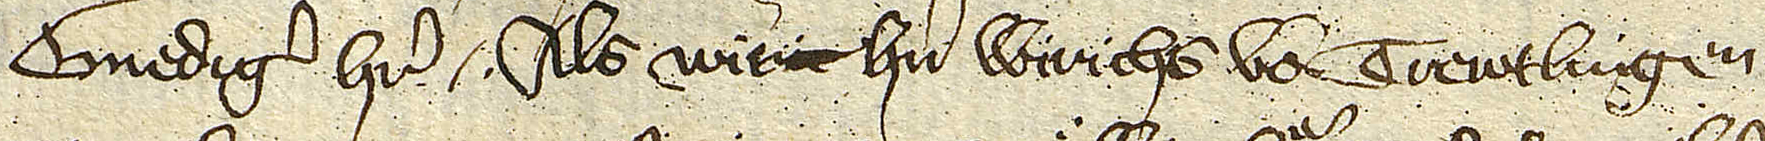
Gnedig* hr* / . ALs wir n hn* wirichs vo* Trewtlingen
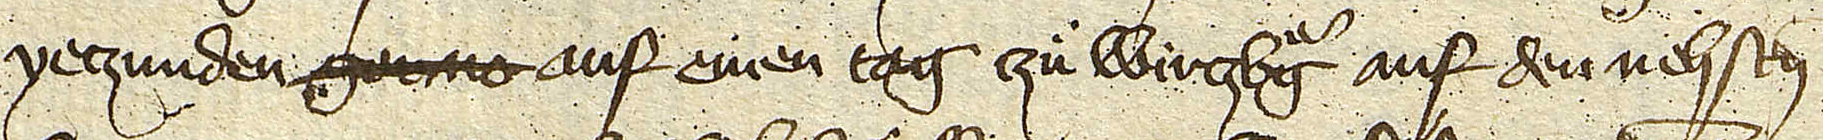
yecʒunden gar no auf einen tag cʒü wircʒb*g auf den nehſtn*
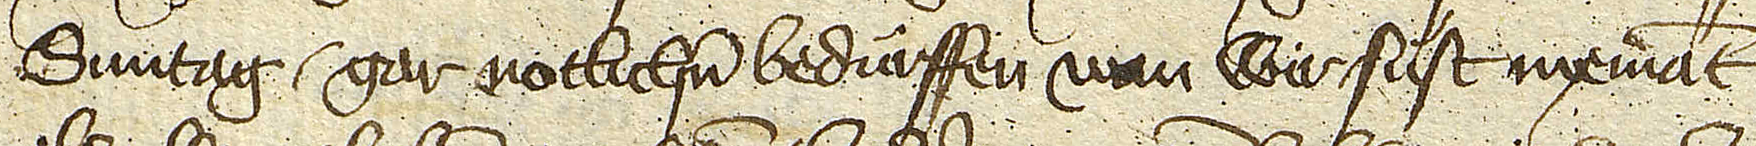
Suntag / gar notlichn* bedürffen wan wir ſüſt nyemat*
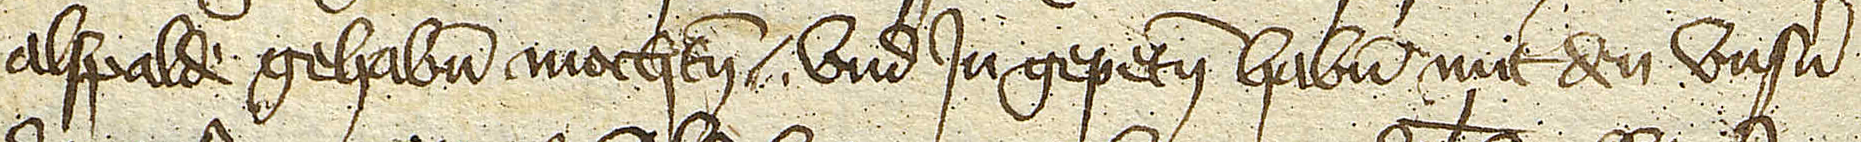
alſpalde gehabn* mochtn* /. vnd In gepetn* habn* mit den vnſn*
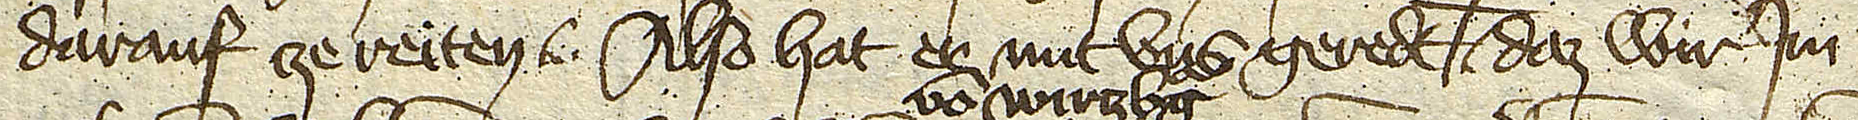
darauf cʒe reiten / . Alſo hat er mit vns geredt / daʒ wir Im
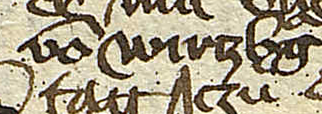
vo* wircʒb*g
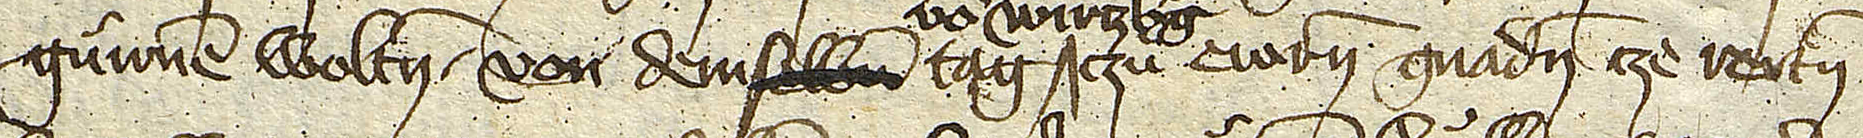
günne* woltn* / von demſelbn* tag cʒu ewrn* gnadn* cʒe reitn*
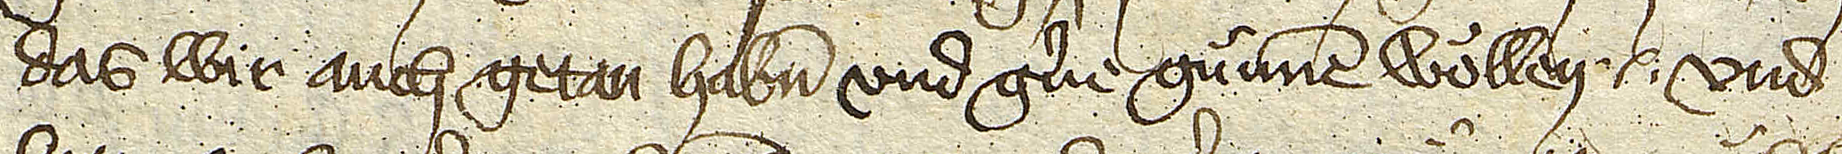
das wir auch getan habn* vnd g*ne günne* wöllen / . vnd
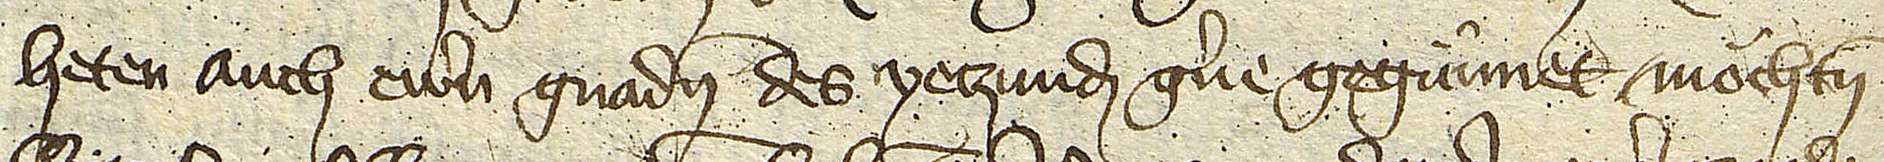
heten auch ew*n gnadn* des yecʒund* g*ne gegünnet / möchtn*
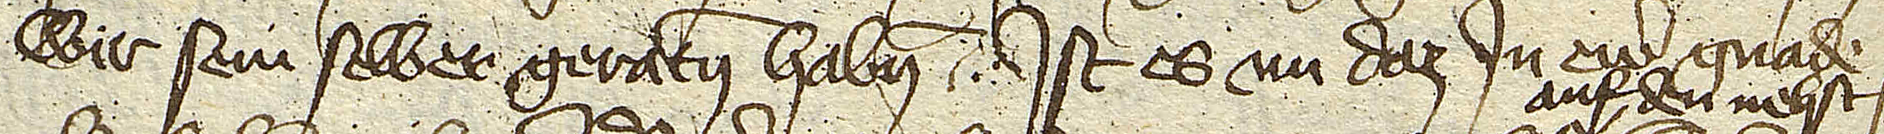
wir ſein ſelber geratn* habn* / . Iſt es nu daʒ In ew* gnade
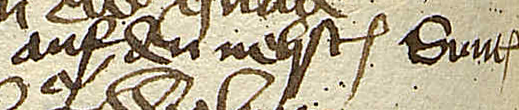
auf den nehſt* Sunt*
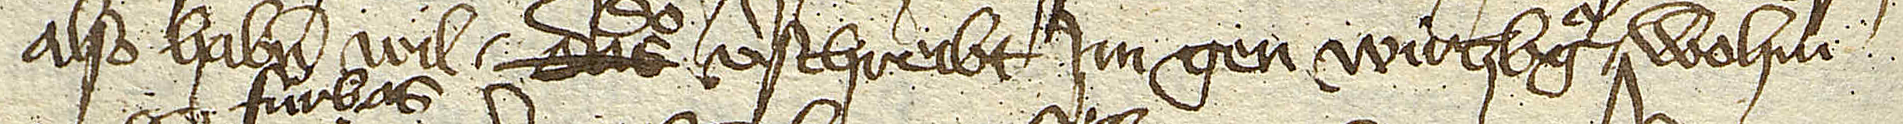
alſo habn* wil / Das v*ſchreibt Im gen wircʒb*g / wohin
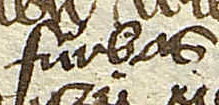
fürbas
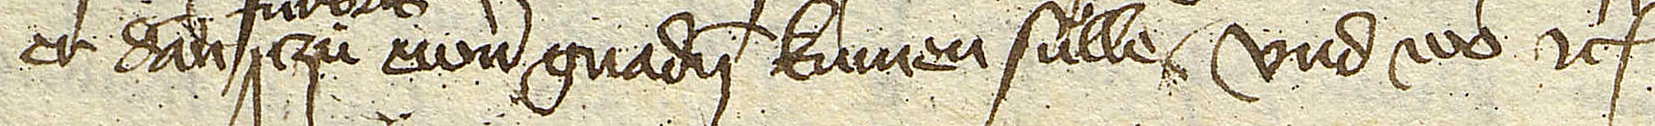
er dan* cʒü ewn* gnadn* kumen ſülle / vnd wo ec*
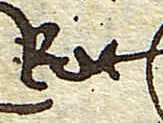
Rot*
